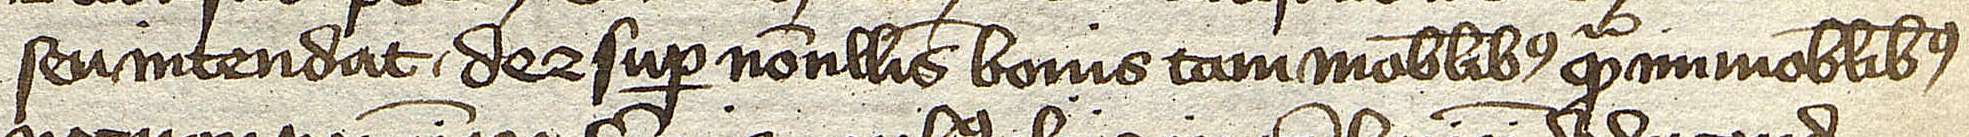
ſeu intendat / de @ ſup* no*nullis bonis tam mob*lib* q* immob*lib*
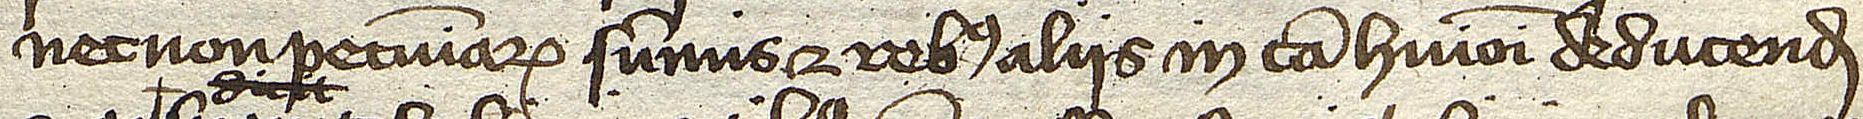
necnon pecu*iar* ſu*mis @ reb* aliis in c*a hui*o*i deducend*
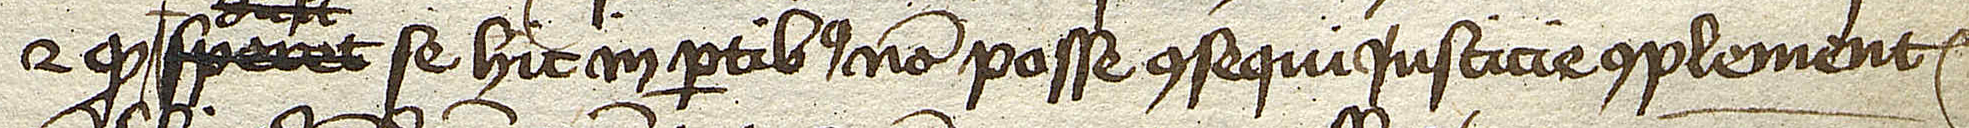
@ q* ſperet ſe hic in p*tib* no* poſſe *ſequi Iuſticie *plement*
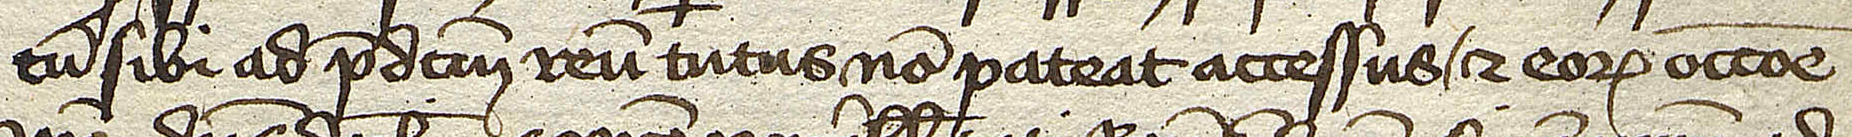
cu* ſibi ad p*d*c*m reu* tutus no* pateat acceſſus / @ eo* occ*o*e
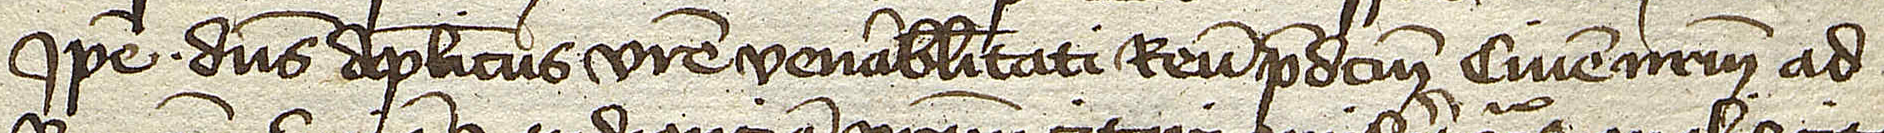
Ip*e . d*n* Ap*licus v*re ven*ab*litati Reu* p*d*c*m Ciue* n*r*m ad
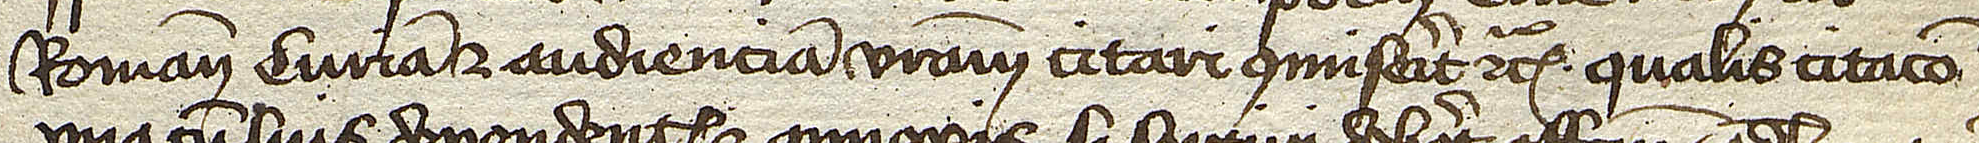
Roman* Curia* @ audiencia* v*ram citari *mise*it ec* . qualis citac*o
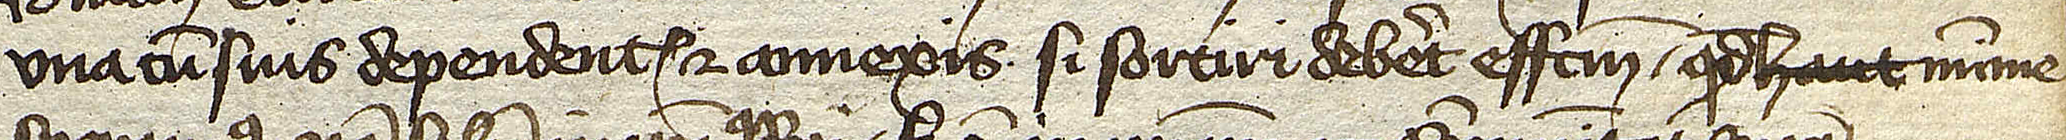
una cu* ſuis dependent* @ annexis . ſi fortiri deb*et eff*c*m / q*d* haut mi*me
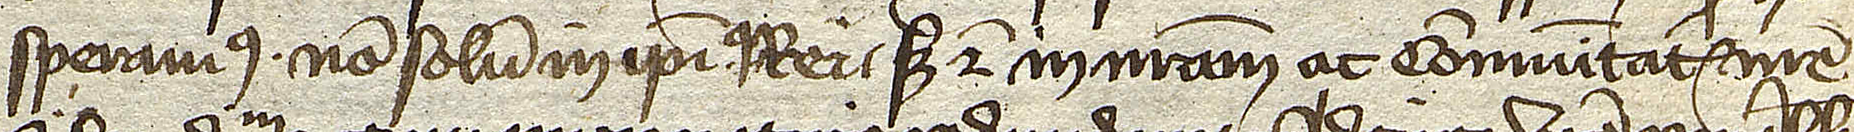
ſperam* . no* ſolu* in ip*i* Rei / ſ* @ in n*ram ac Co*mu*itat* n*re
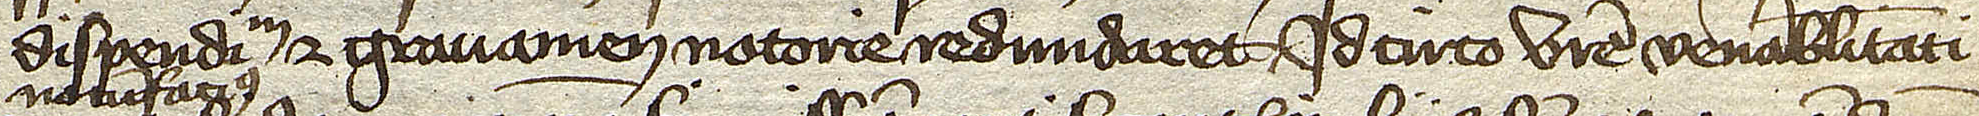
diſpendi*m et grauamen notorie redundaret / Idcirco v*re ven*ab*litati
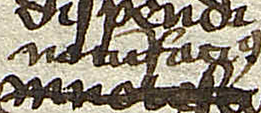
no* fac*u*
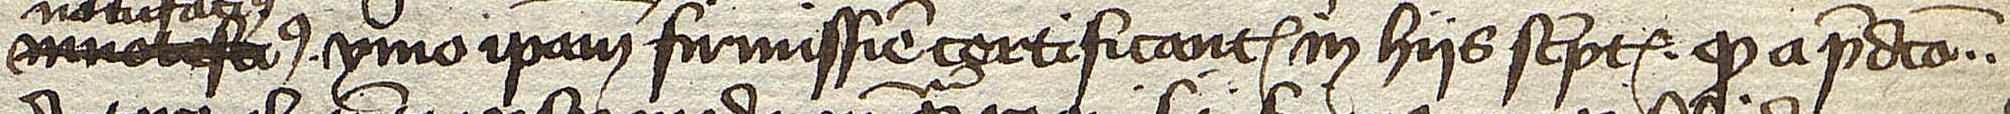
mnoteſti* . ymo ip*am firmiſſi*e certificant* in hiis ſc*pt* . q* a p*d*c*o . .
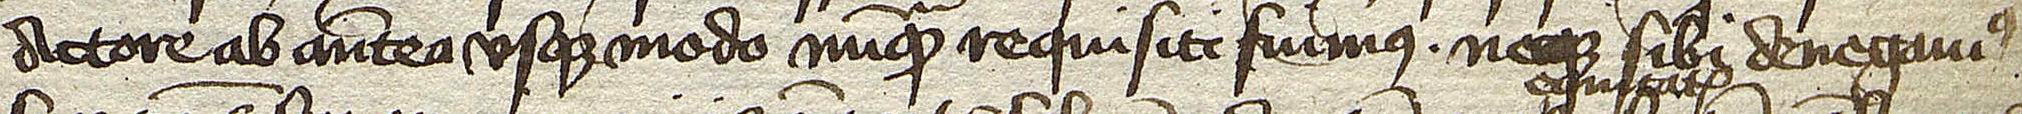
Actore ab antea vsq* modo nu*q* requiſiti fuim* neq* ſibi denegam*
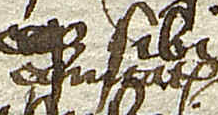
equitat*
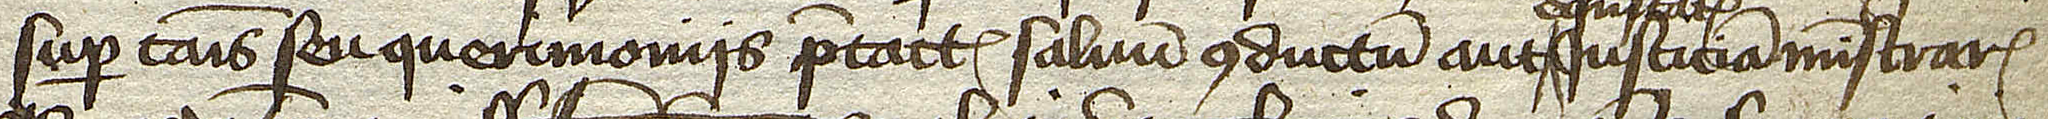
ſup* ca*is ſeu querimoniis p*tact* ſaluu* *ductu* aut Iuſticia* mi*ſtrar*
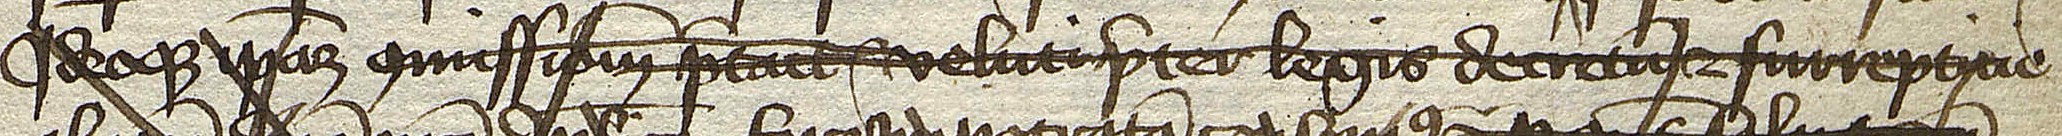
Ideoq* ipa* *miſſiom* ptact* veluti*pter legis de%%% @ furrepticie
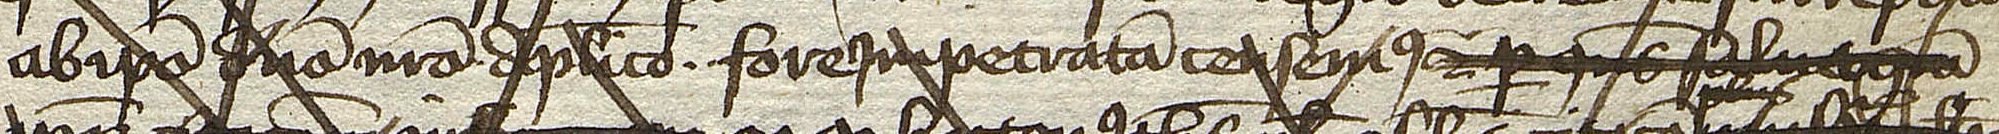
abipo* dno* nro* . Aplico* . fore Impetrata* cenſeni* @ p* quis* ſalut%%%
